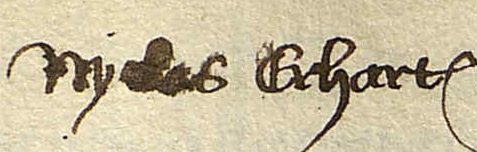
Nyclas Erhart*
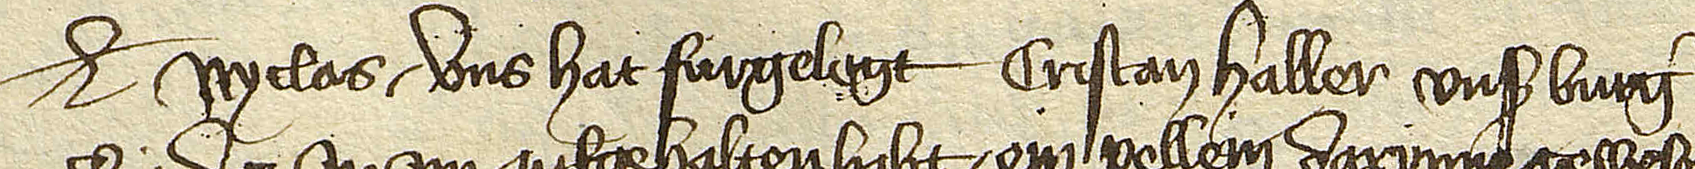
L* Nyclas / Vns hat fürgelegt Criſtan haller vnſ* burg*
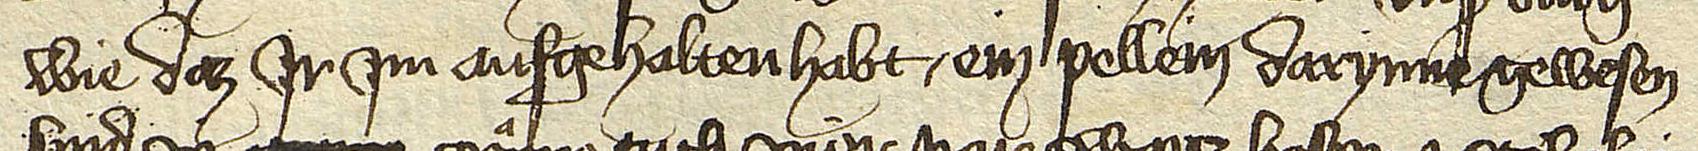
wie daʒ Ir Im aufgehalten habt / ein pellein darynne geweſen
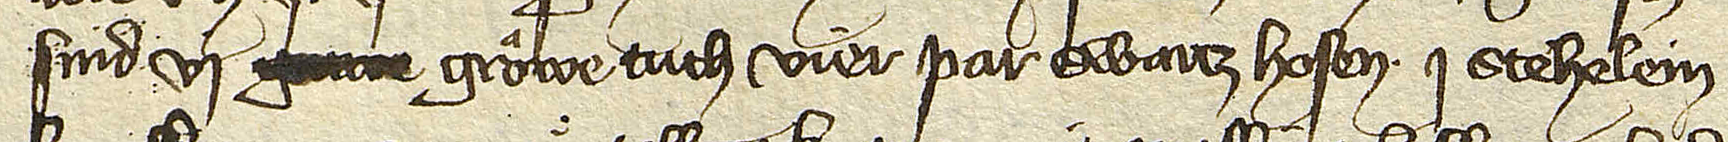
ſind vi* g%%we gröwe tuch vier par Swarcʒ hoſen i Stehelein
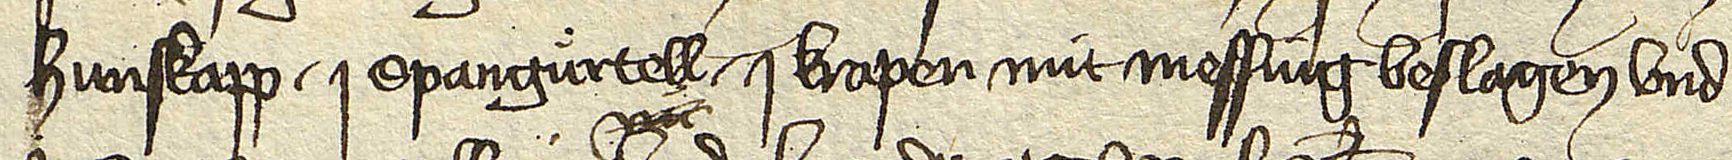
hunſkapp / i Spangürtell / i krapen mit meſſing beſlagen vnd
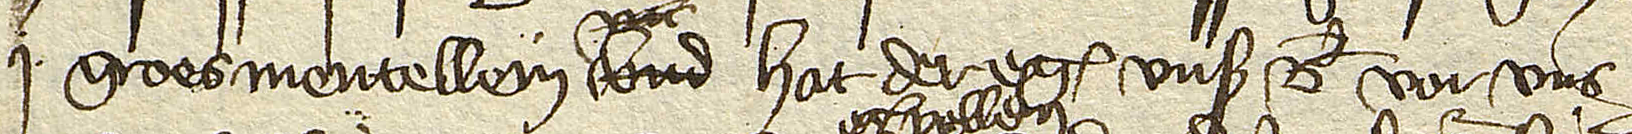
i groes mentellein / vnd hat der eg* vnſ* B* vor vns
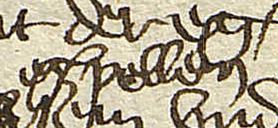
eg* pellein
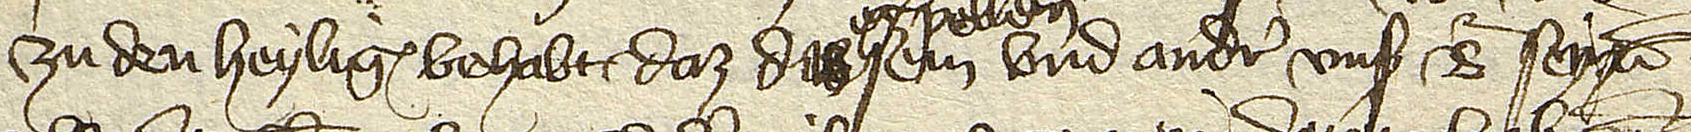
cʒu den heylig* behabt / daʒ die ſein vnd andr* vnſ* B* ſein %%
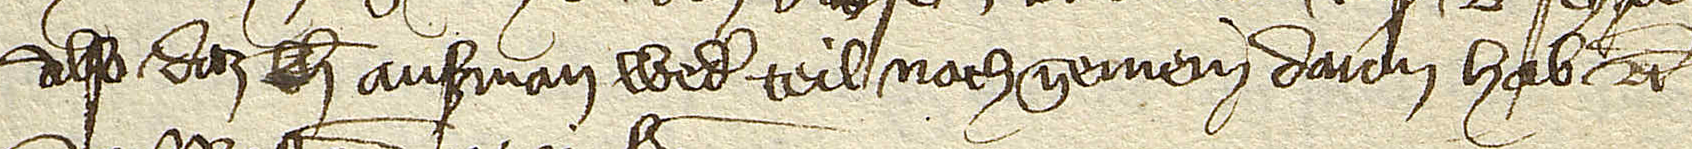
Alſo / daʒ kh* auſʒman wed* teil noch gemein daran hab ec*
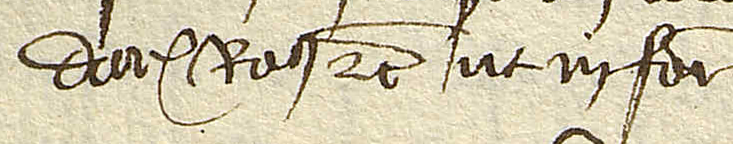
dar* Ro* ec* ut in for*
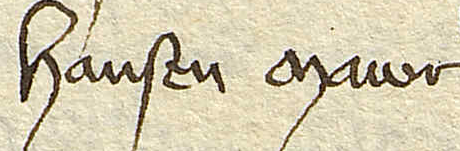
hanſen Mawr*
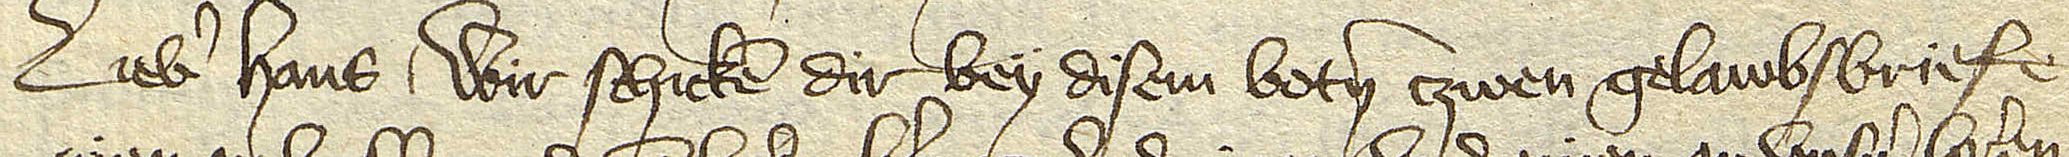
Lieb* hans / Wir ſchicke* dir bey diſem botn* cʒwen gelawbſbriefe
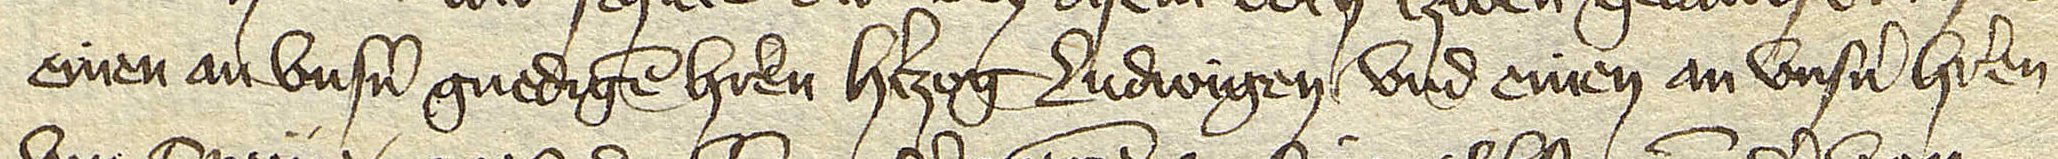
einen an vnſn* gnedige* hr*en h*cʒog Ludwigen / vnd einen an vnſn* hr*en
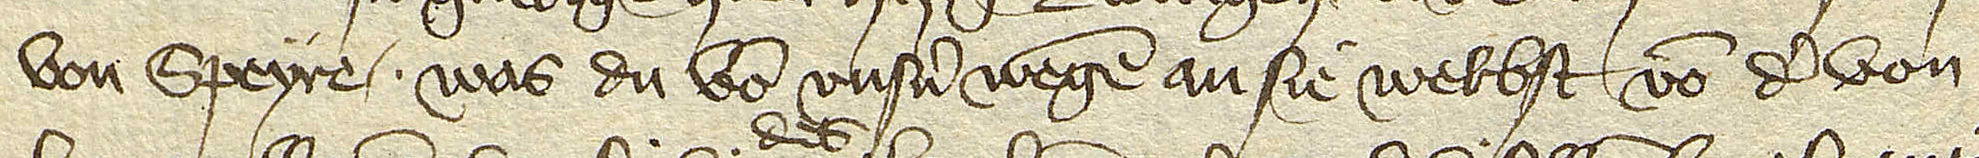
von Speyre / . was du vo* vnſn* wege* an ſie werbſt vo* d* von
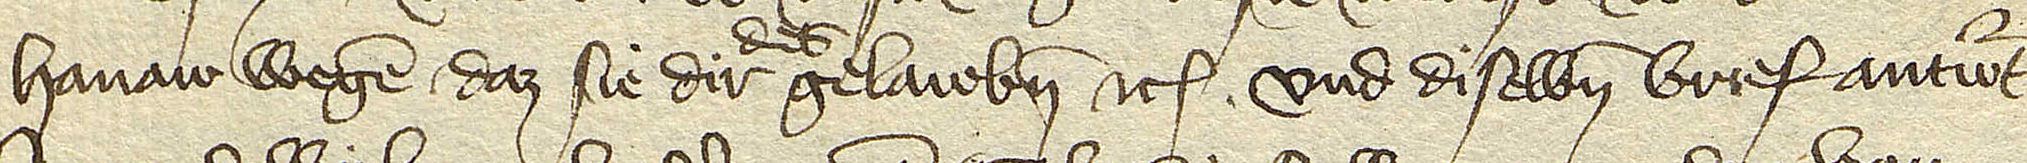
hanaw wege* / daʒ ſie dir gelawbn* ec* . vnd diſelbn* brief antw*t
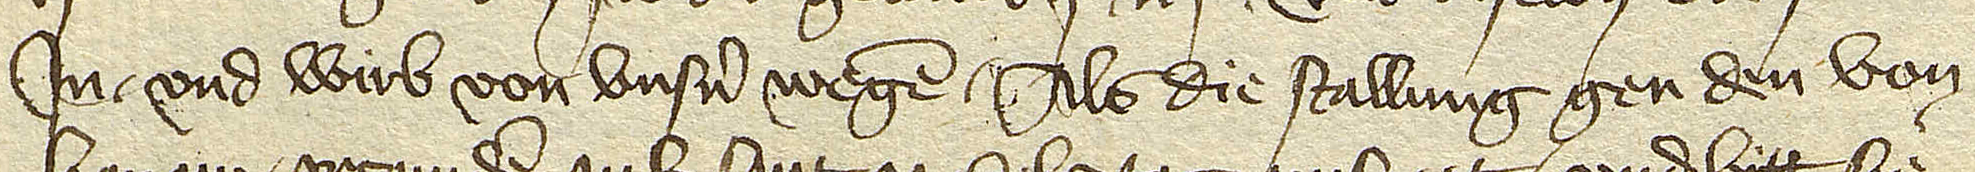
In / vnd wirb von vnſn* wege* / Als die ſtallung gen den von
